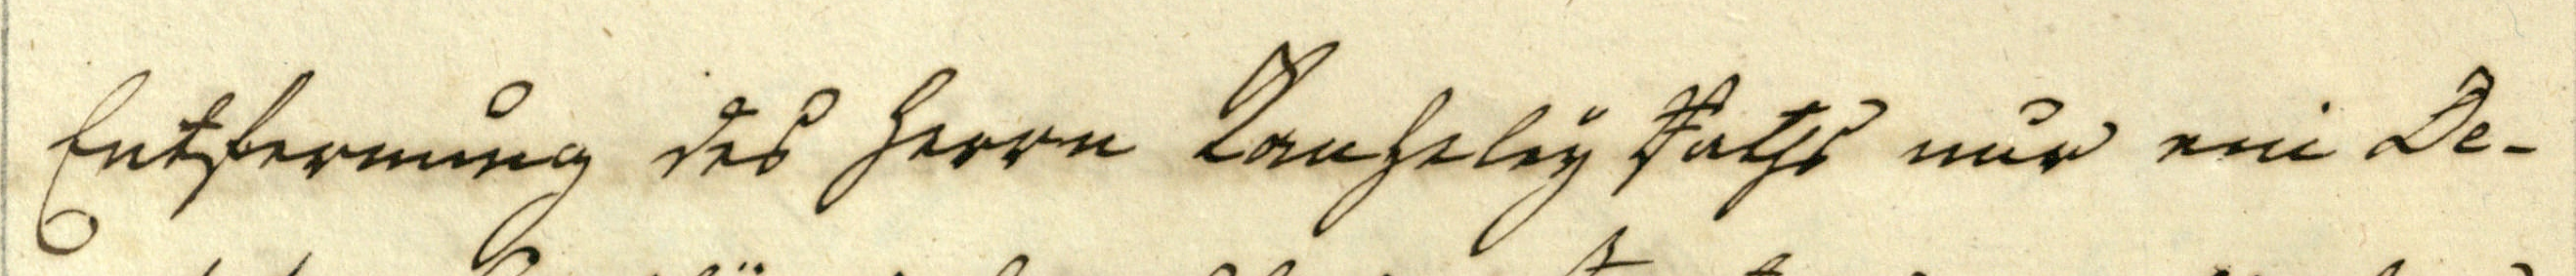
Entfernung des Herrn Kanzeleÿ Raths nur ein De¬
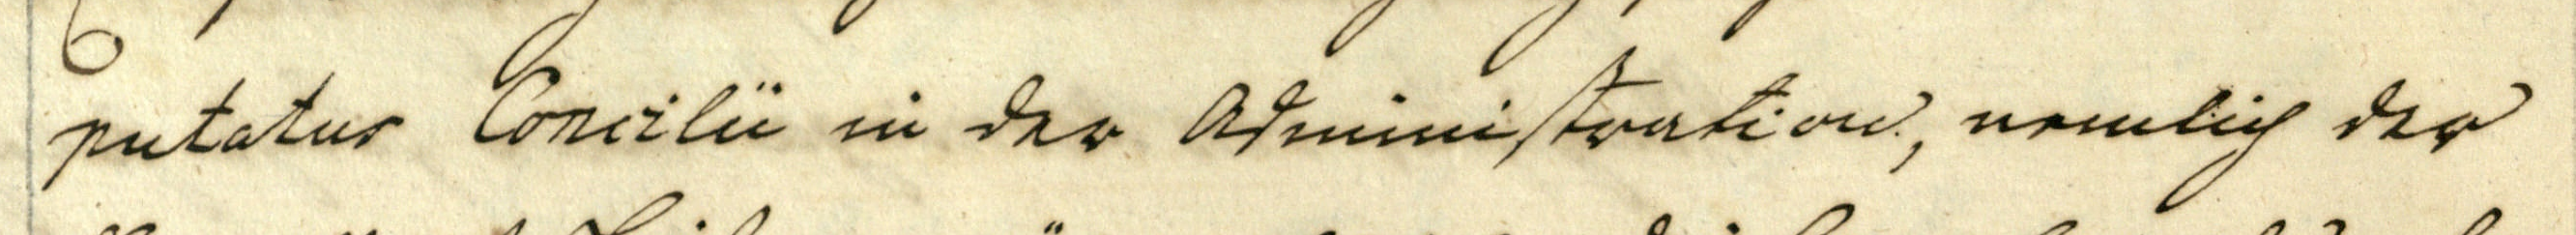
putatus Concilii in der Administration, nemlich der
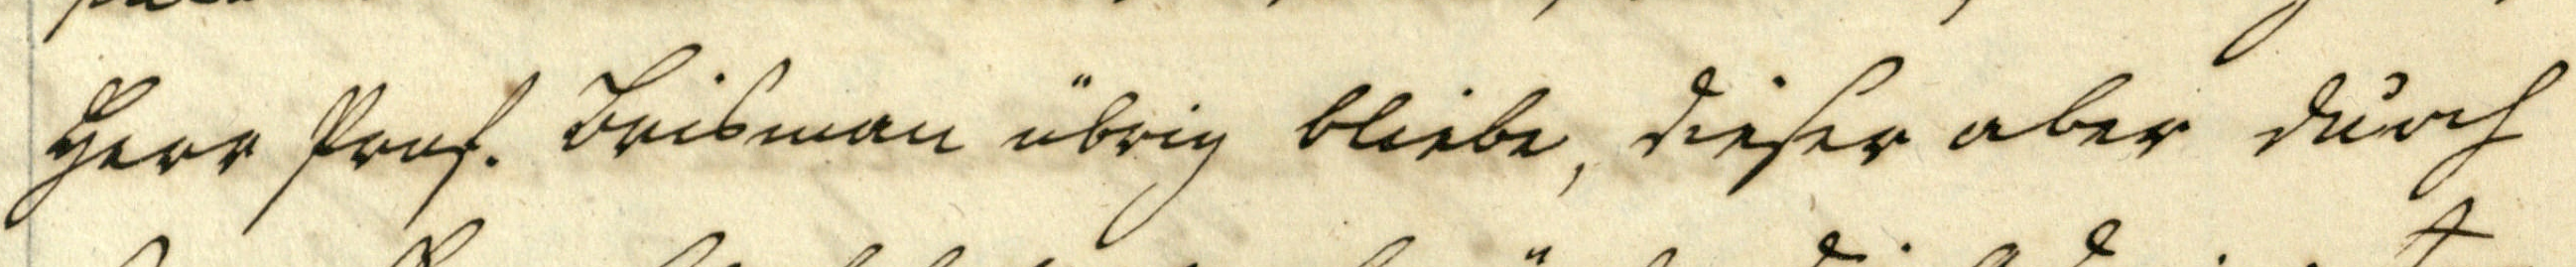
Herr Prof. Brisman übrig bliebe, dieser aber durch
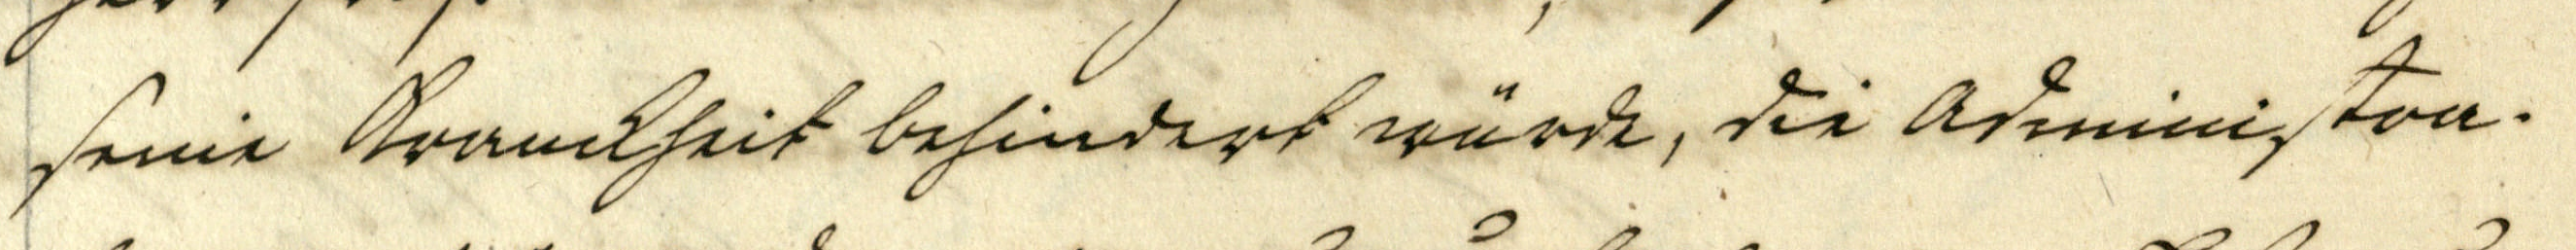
seine Kranckheit behindert würde, die Administra¬
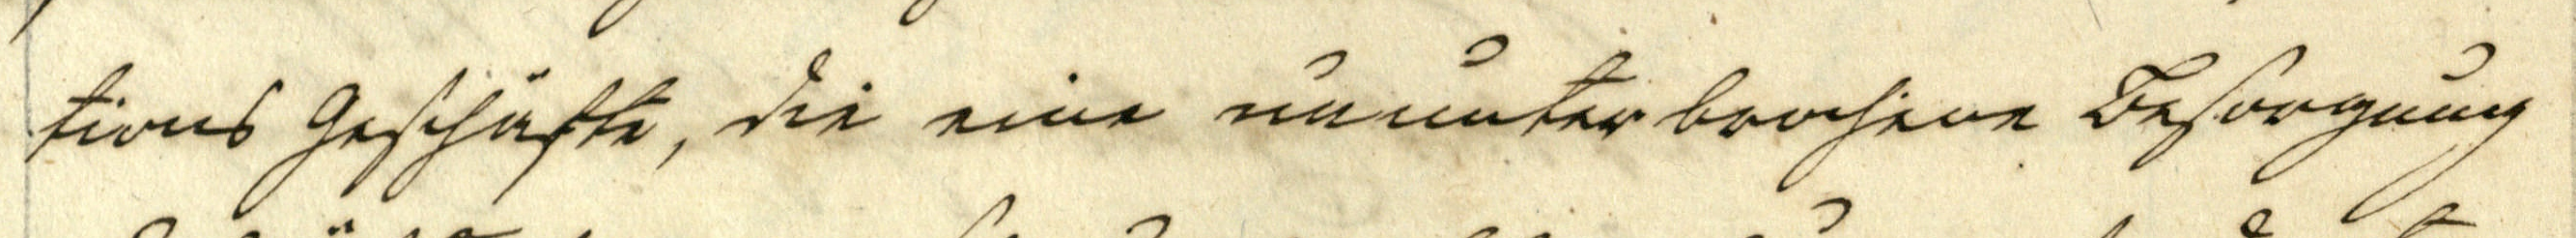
tions Geschäfte, die eine ununterbrochene Besorgung
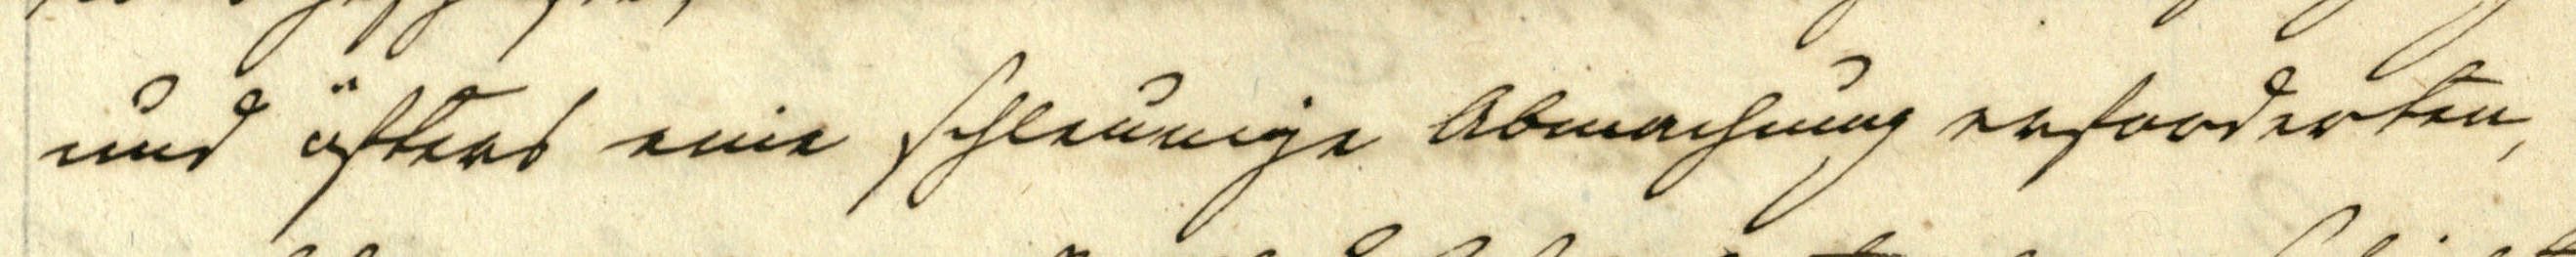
und öfters eine schleunige Abmachung erforderten,
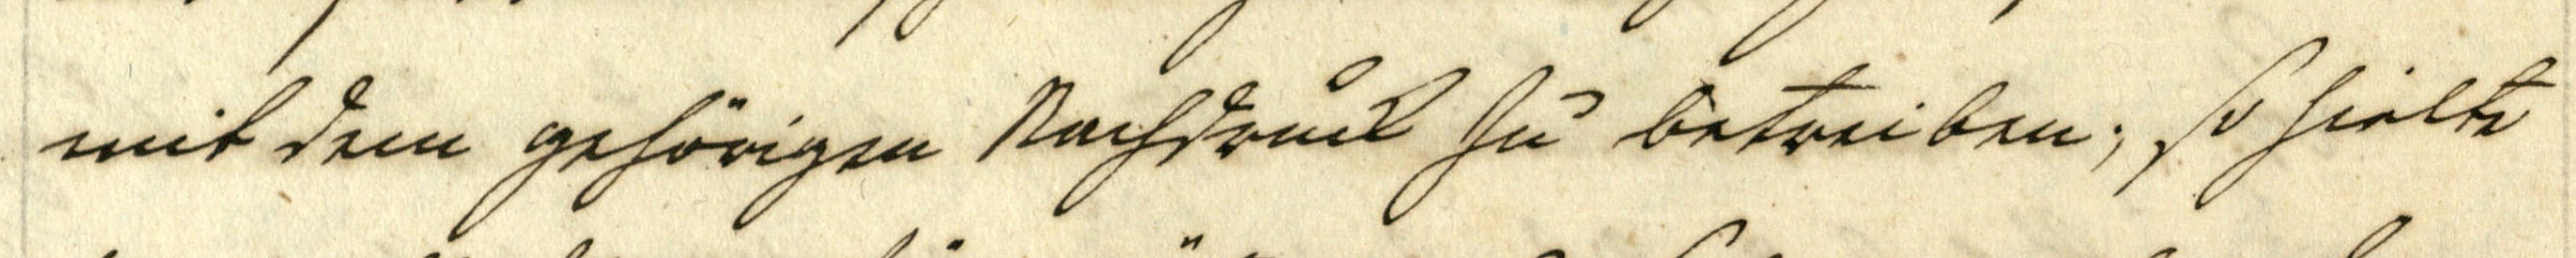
mit dem gehörigen Nachdruck zu betreiben; so hielte
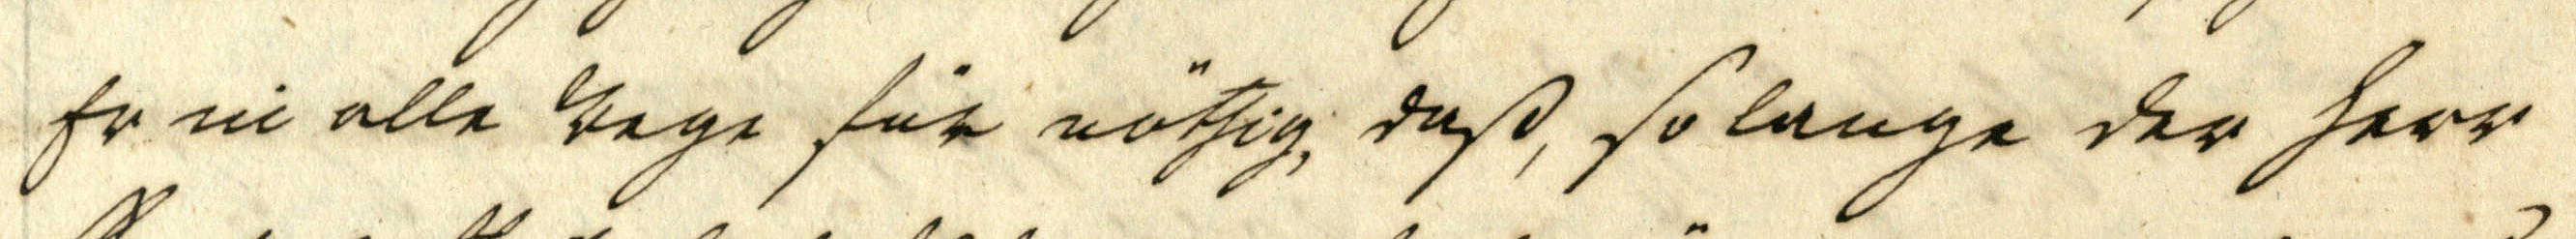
Er in alle Wege für nöthig, daß, solange der Herr
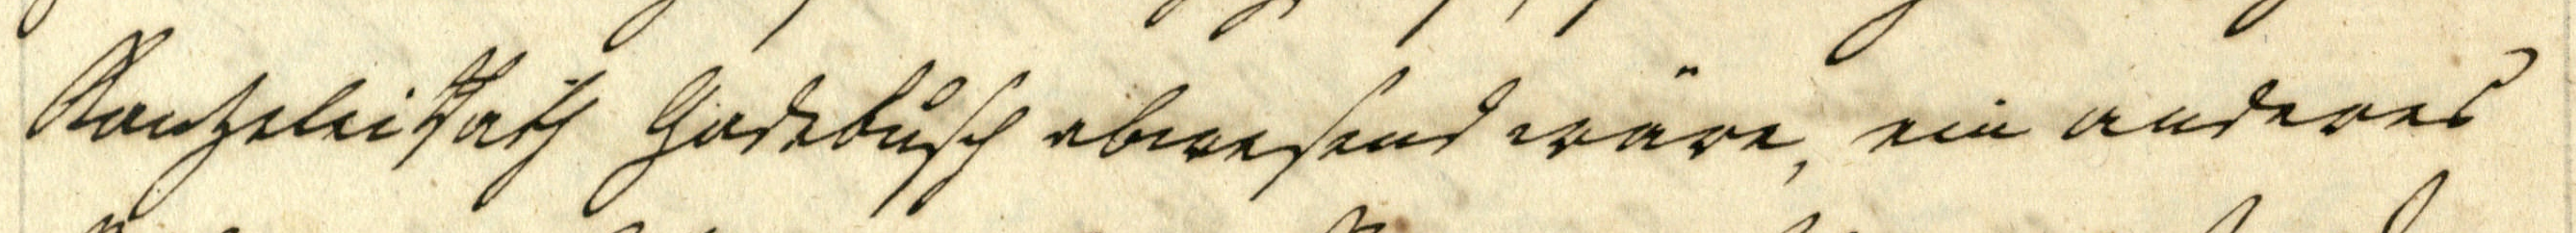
KanzeleiRath Gadebusch abwesend wäre, ein anderes
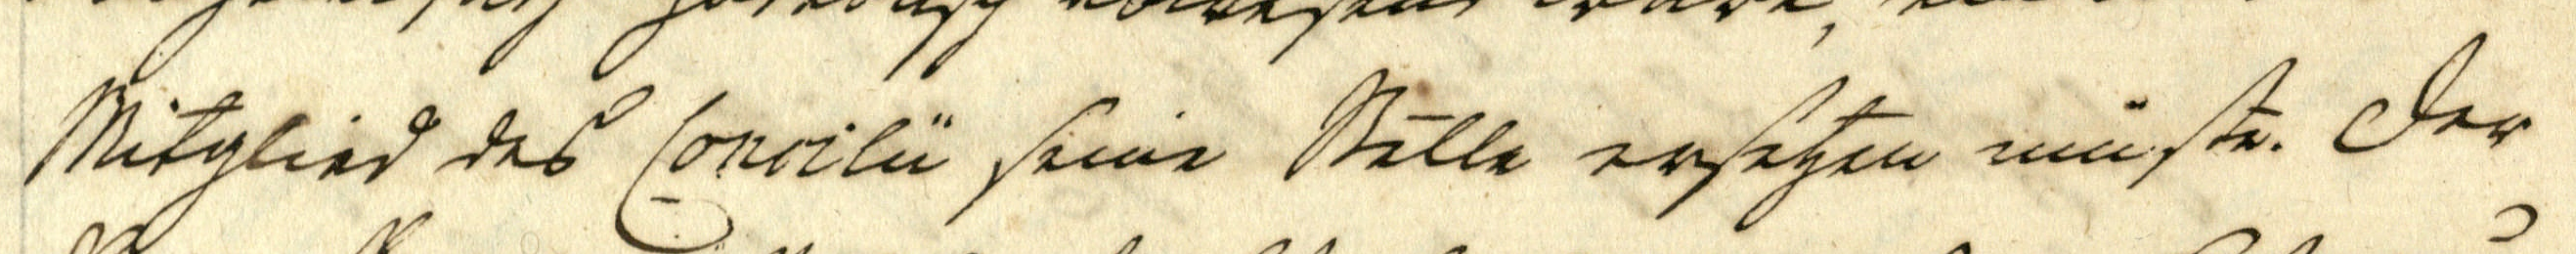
Mitglied des Concilii seine Stelle ersetzen müßte. Der
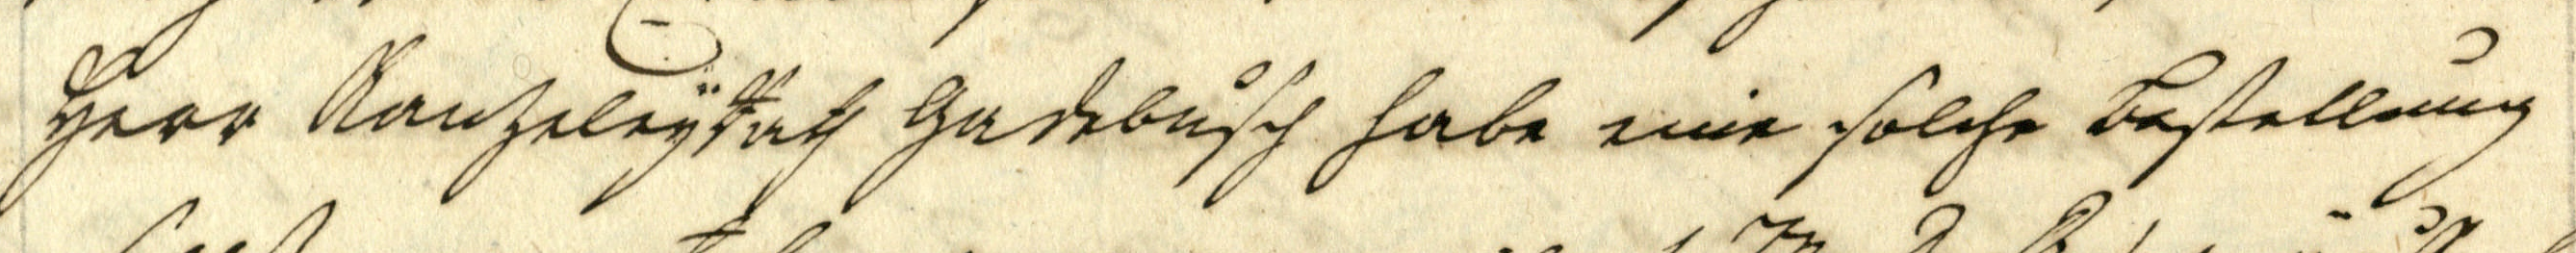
Herr KanzeleÿRath Gadebusch habe eine solche Bestellung
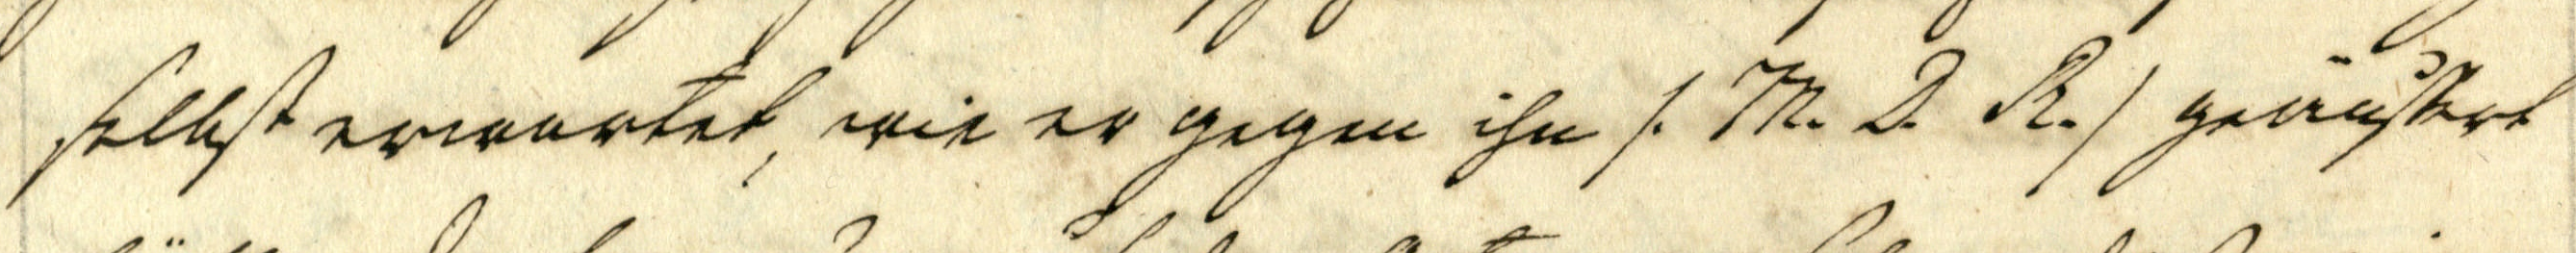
selbst erwartet, wie er gegen ihn /. M. D. R./ geäussert
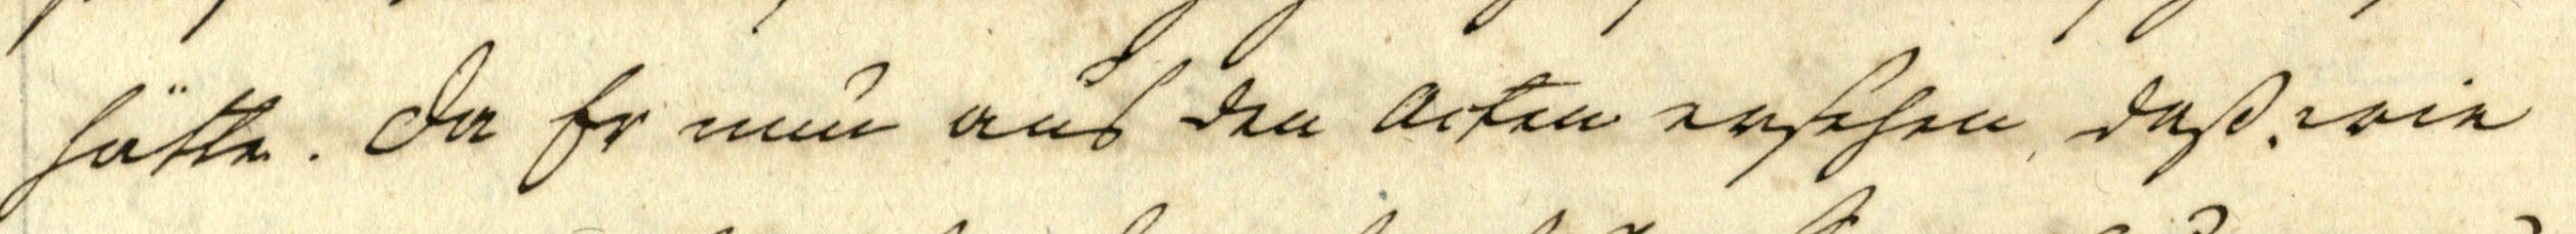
hätte. Da Er nun aus den Acten ersehen, daß wie
